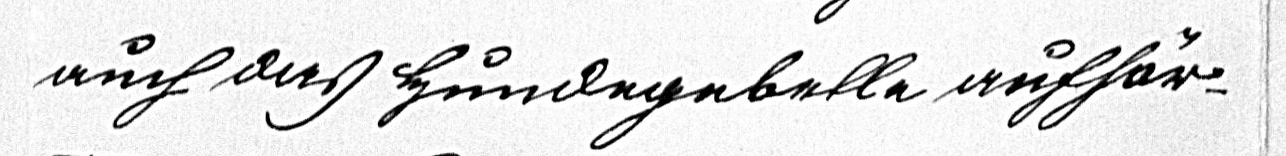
auch das Hundegebelle aufhör¬
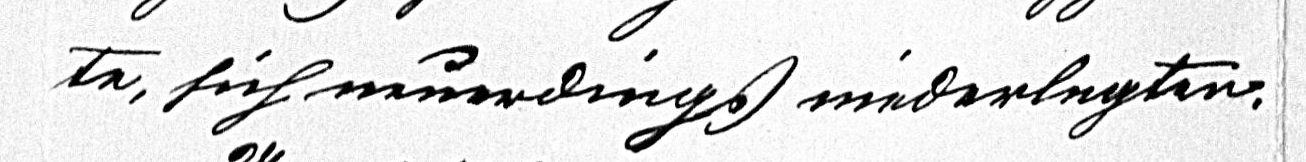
te, sich neuerdings niederlegten.
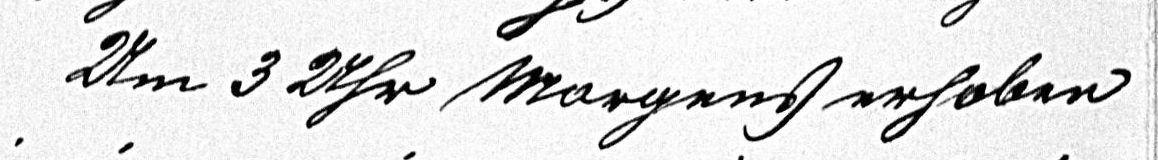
Am 3 Uhr Morgens erhoben
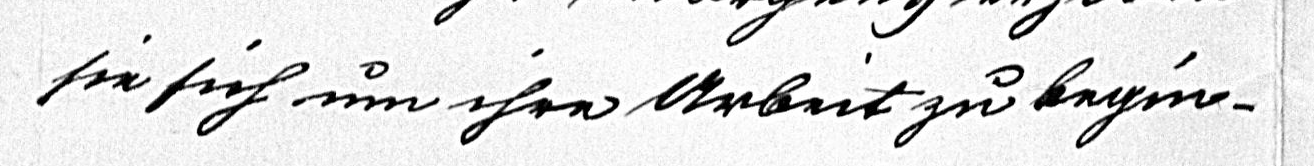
sie sich um ihre Arbeit zu begin¬
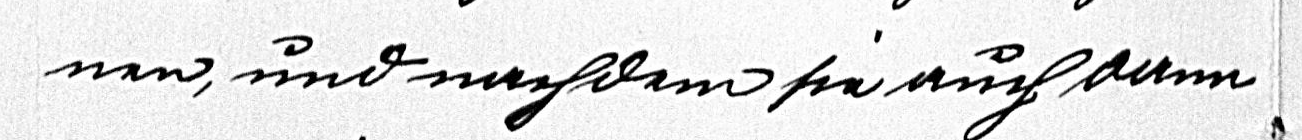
nen, und nachdem sie auch dann
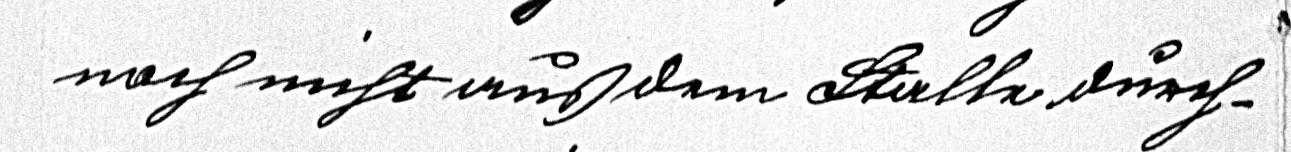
noch nicht aus dem Stalle durch¬
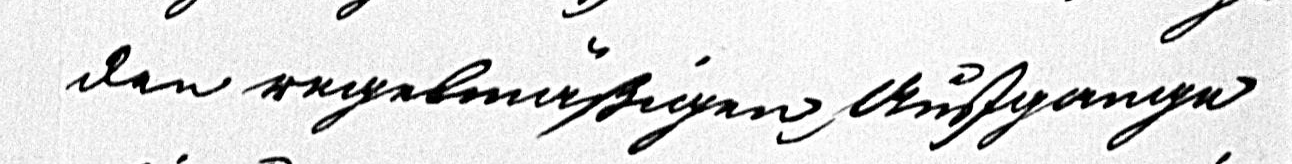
den regelmäßigen, Außgange
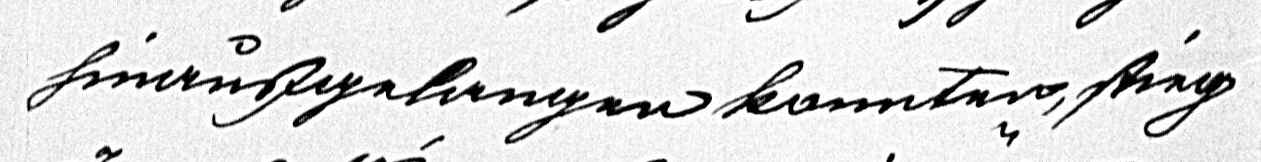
hinausgelangen konnten, stieg
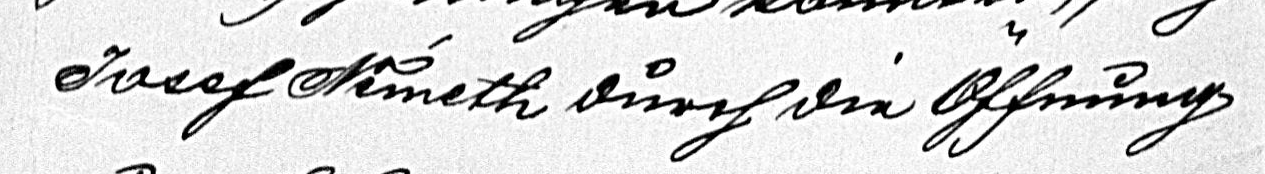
Josef Németh durch die Öffnung
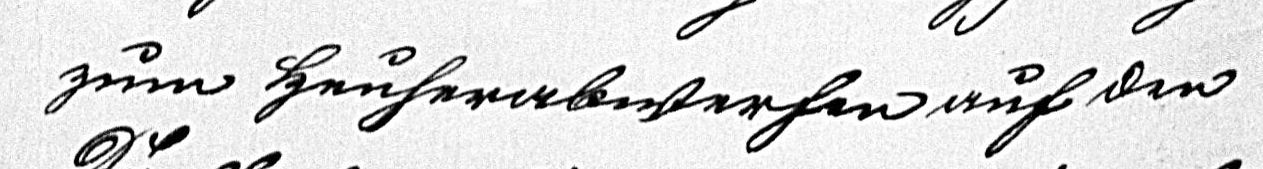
zum Heuherabwerfen auf den
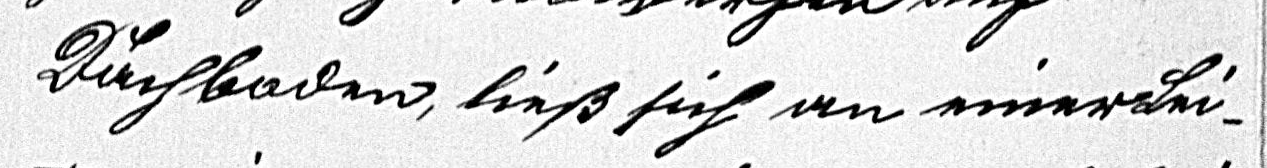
Dachboden, ließ sich an einer Lei¬
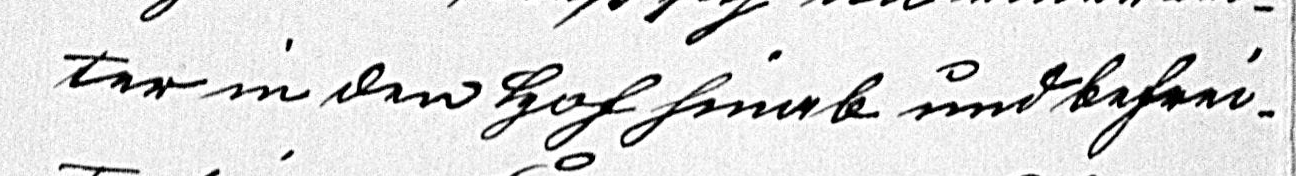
ter in den Hof hinab und befrei¬
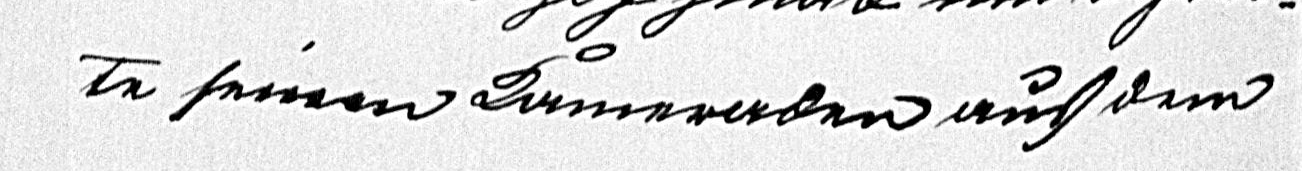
te seinen Kameraden aus dem
